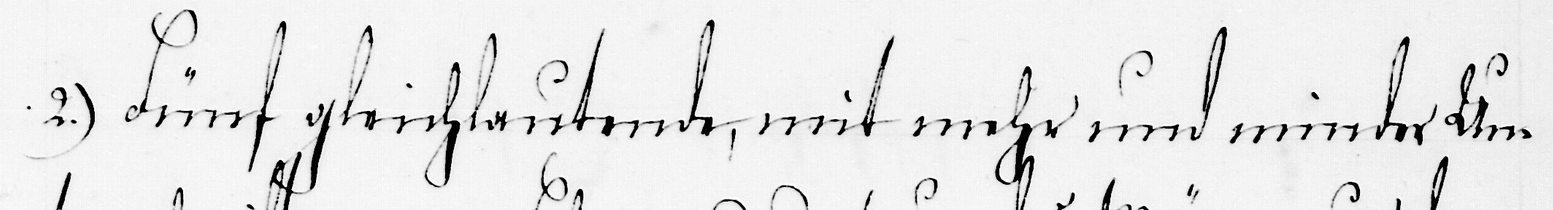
2.) Fünf gleichlautende, mit mehr und minder Un¬
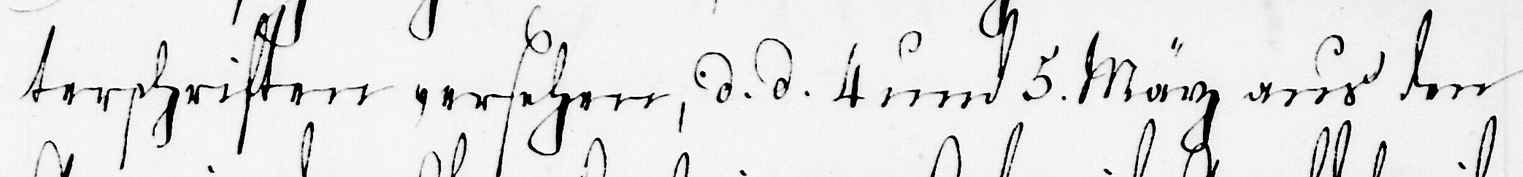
terschriften versehen, d. d. 4. und 5. März aus den
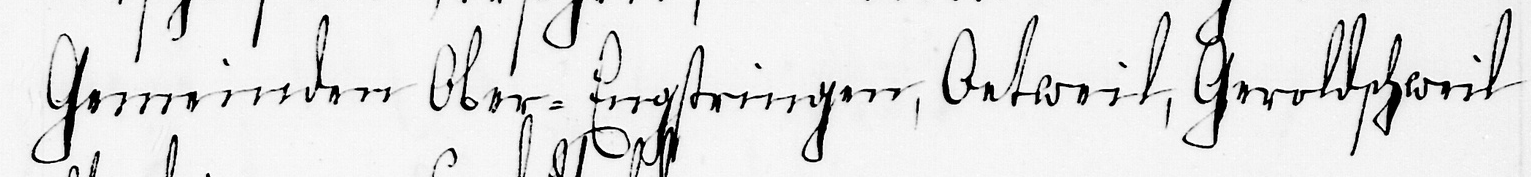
Gemeinden Ober-Engstringen, Oetweil, Geroldschweil,
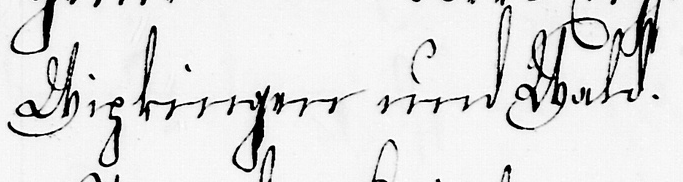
Wipkingen und Wald.
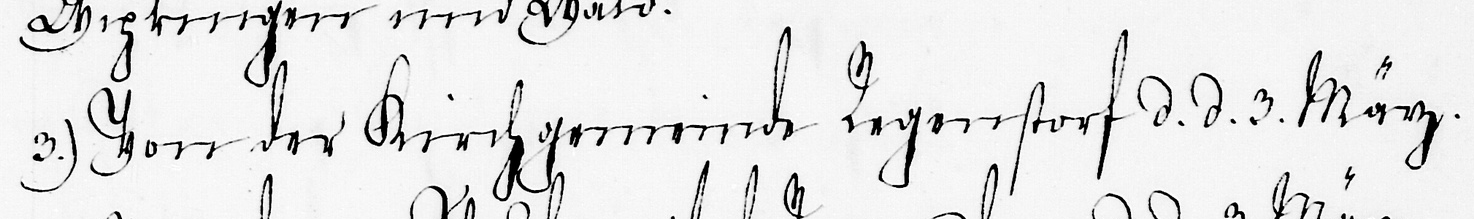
3.) Von der Kirchgemeinde Regenstorf d. d. 3. März .
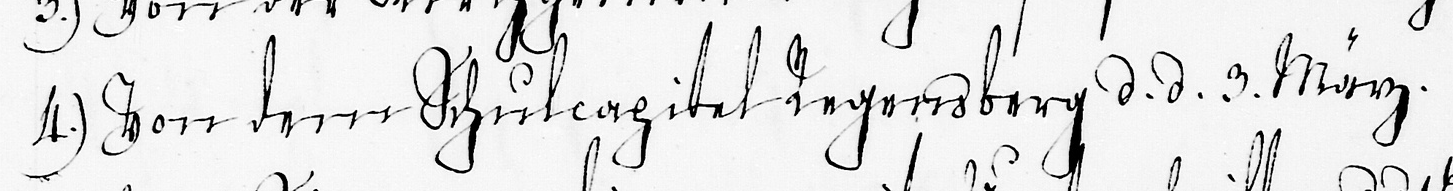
4.) Von dem Schulcapitel Regensberg d. d. 3. März.
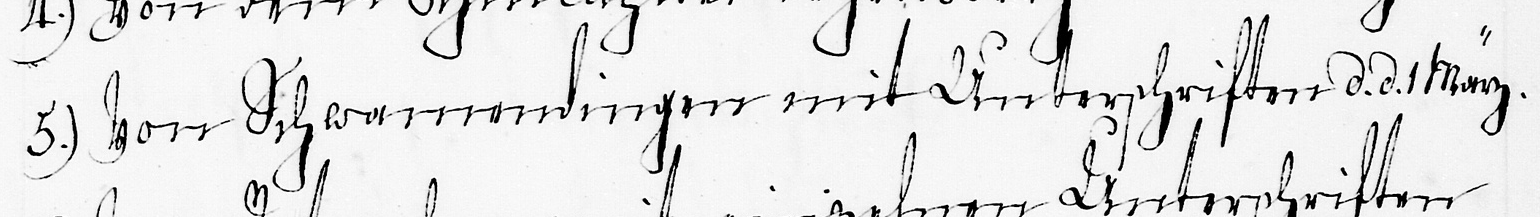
5.) Von Schwamendingen mit Unterschriften d. d. 1. März.
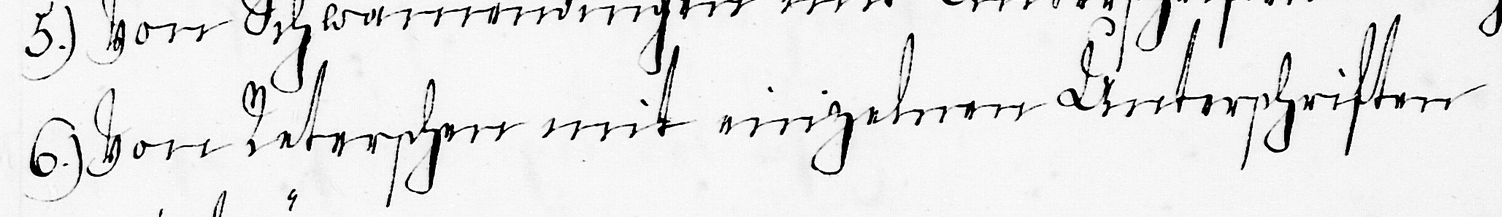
6.) Von Reterschen mit einzelnen Unterschriften
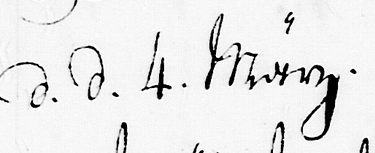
d. d. 4. März.
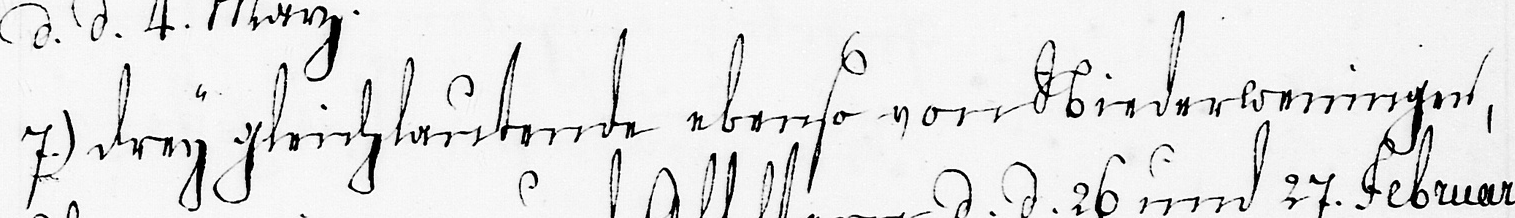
7.) Drey gleichlautende ebenso von Niederweningen,
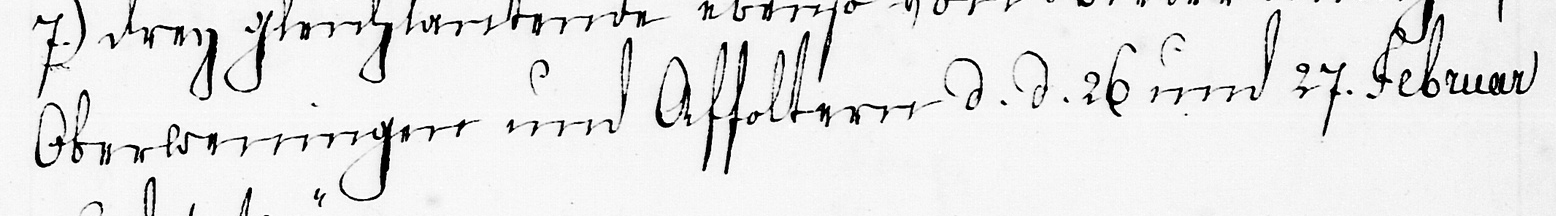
Oberweningen und Affoltern d. d. 26. und 27. Februar
